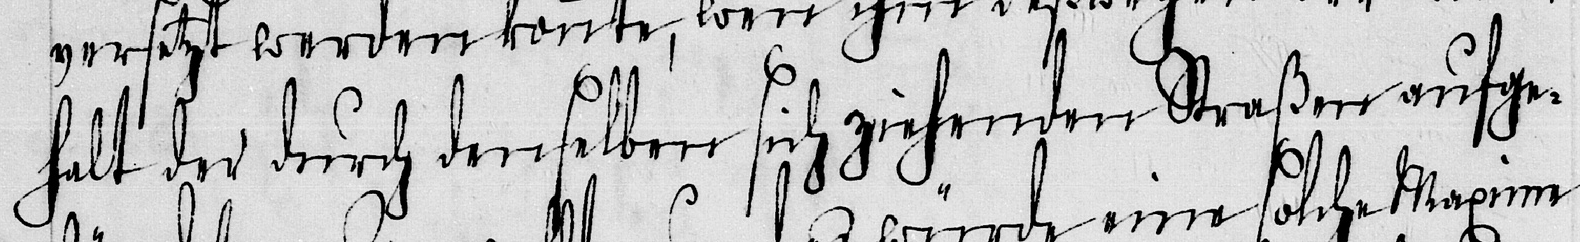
halt der durch denselben sich ziehenden Straßen aufge¬
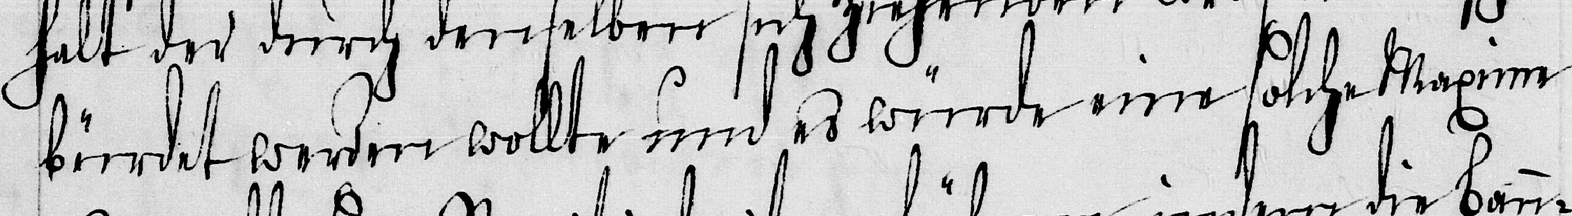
bürdet werden wollte und es würde eine solche Maxime
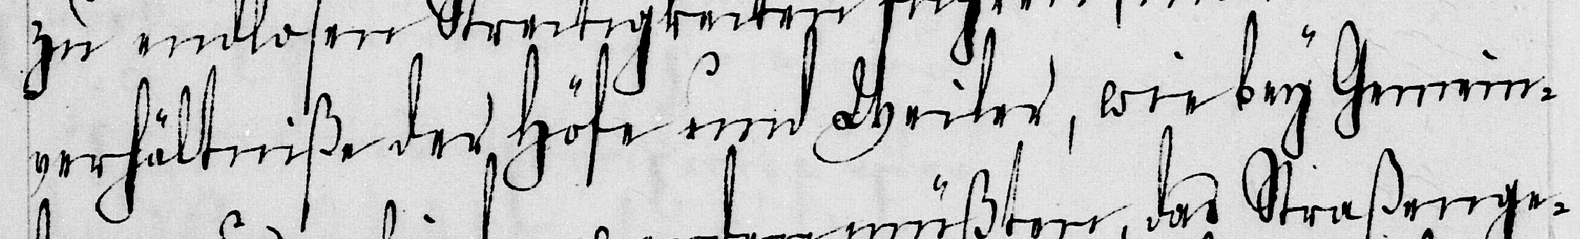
verhältniße der Höfe und Weiler, wie bey Gemein¬
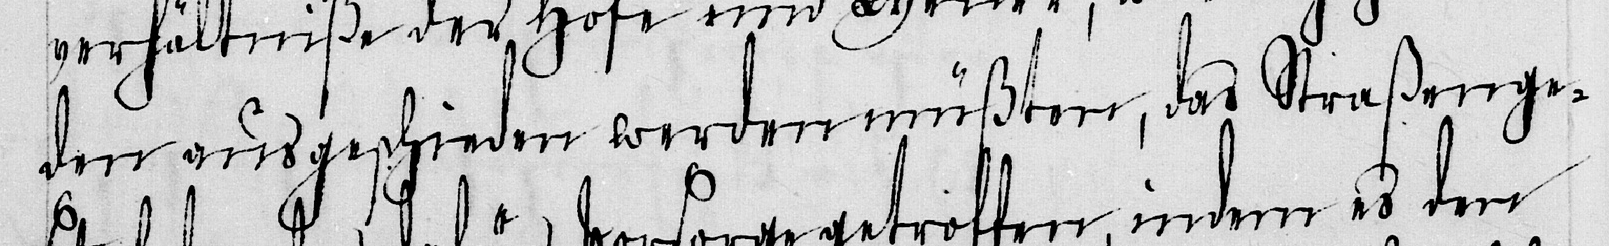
den ausgeschieden werden müßten, das Straßenges¬
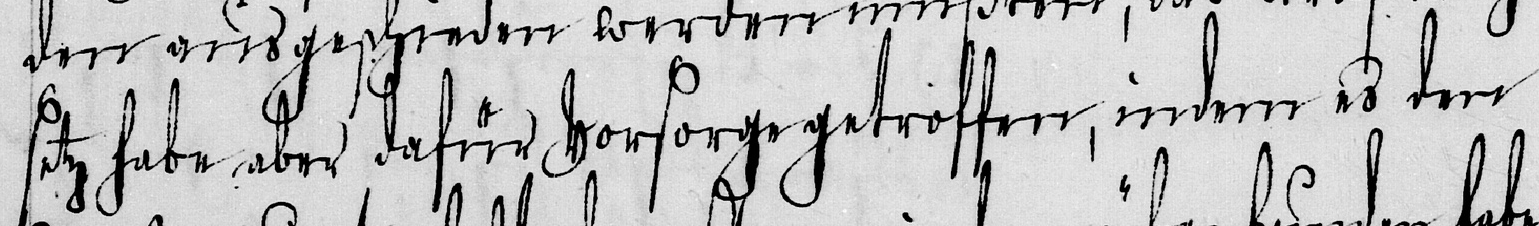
etz habe aber dafür Vorsorge getroffen, indem es den
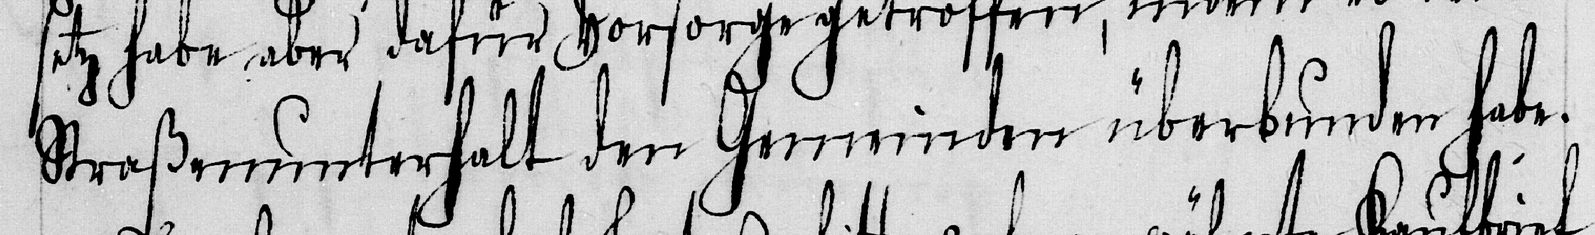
Straßenunterhalt den Gemeinden überbunden habe.
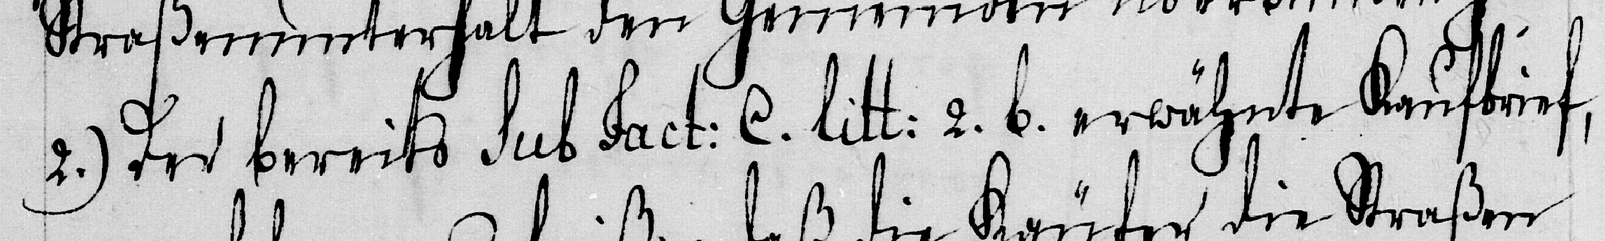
2.) Der bereits sub Fact: C. litt: 2. b. erwähnte Kaufbrief,
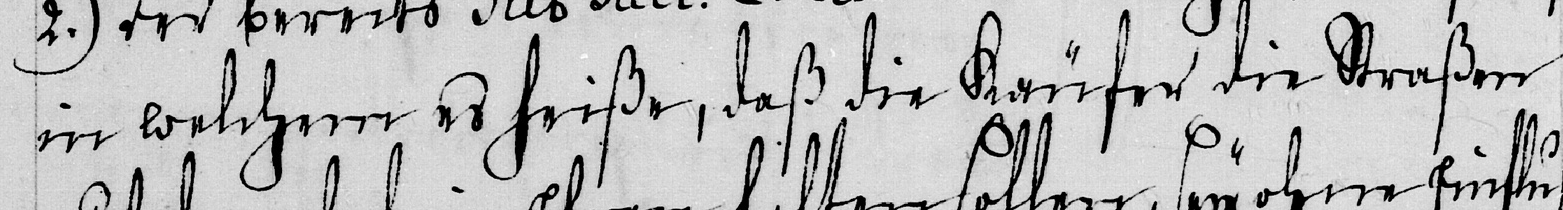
in welchem es heiße, daß die Käufer die Straßen
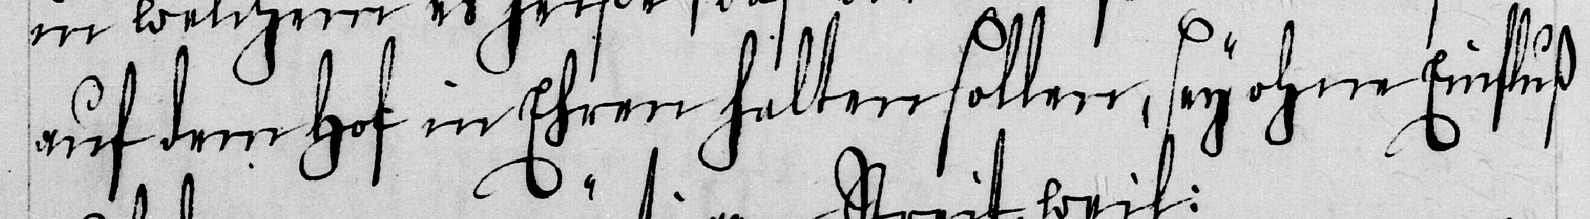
auf dem Hof in Ehren halten sollen, sey ohne Einfluß
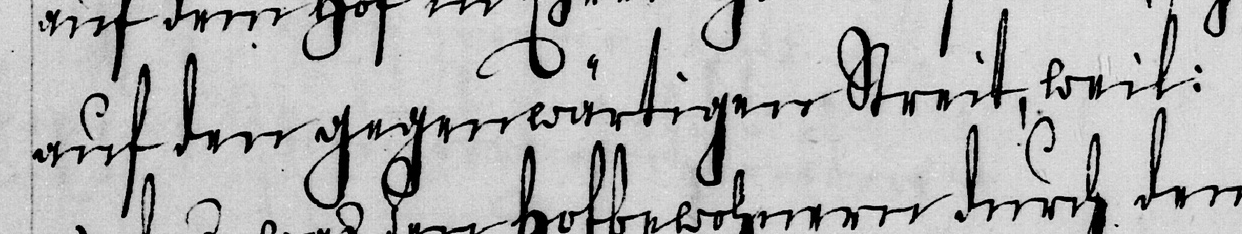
auf den gegenwärtigen Streit, weil:
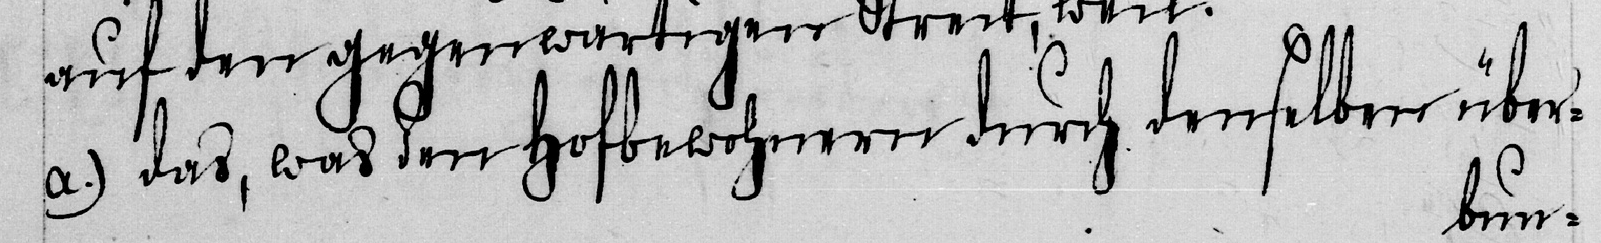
a.) das, was den Hofbewohnern durch denselben über-
